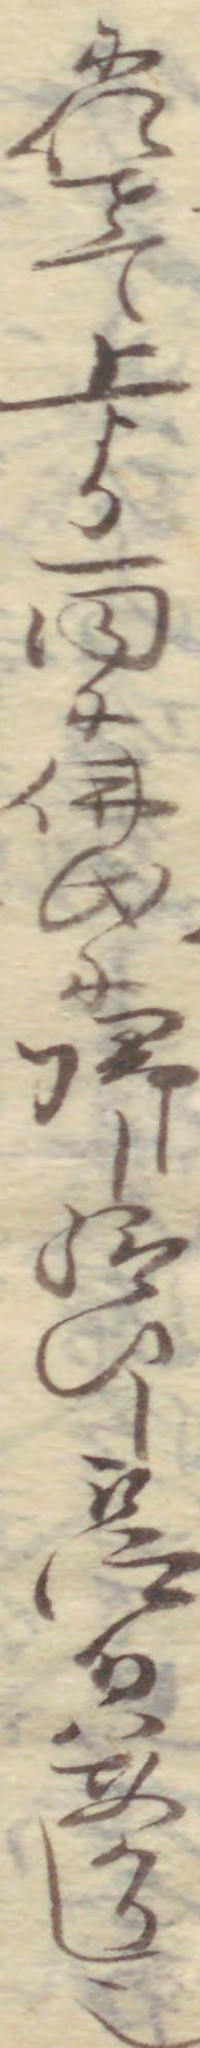に任せて上より一同に仏氏に帰し給ひし被仰付はなかりし也
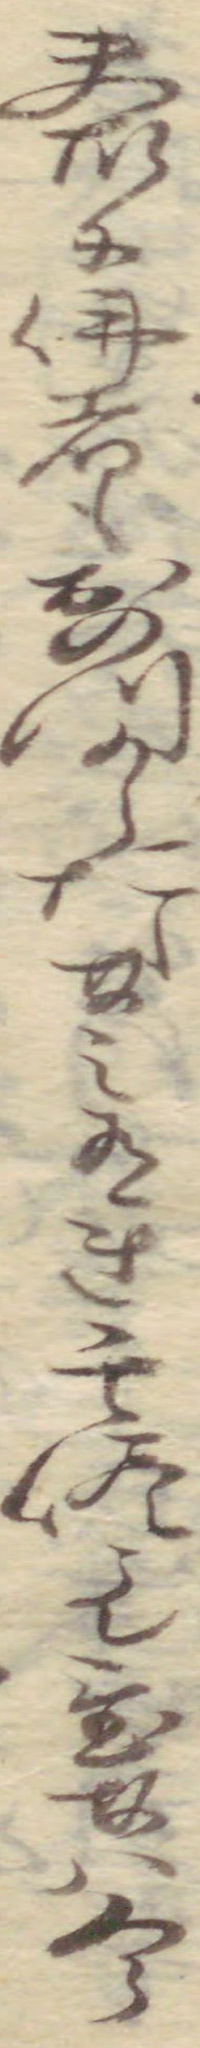夫故に仏者もおのつからたしなみ有き其侭ニて置なは今
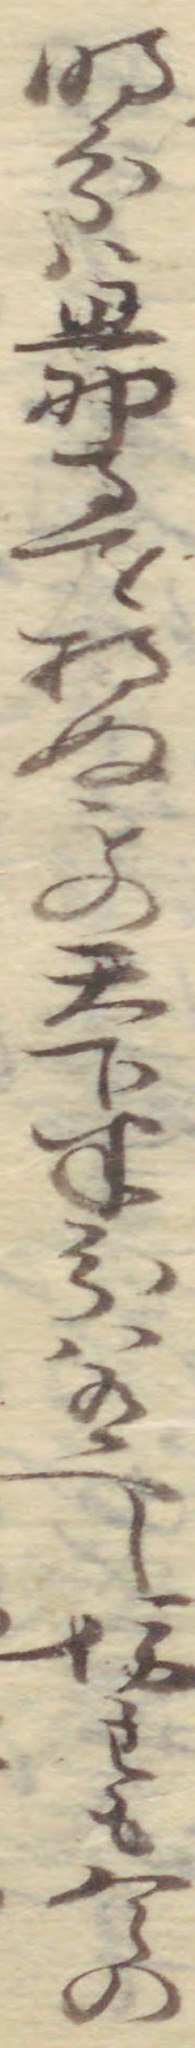時分は旦那寺を持ぬもの天下半分は有へし坊主も今の
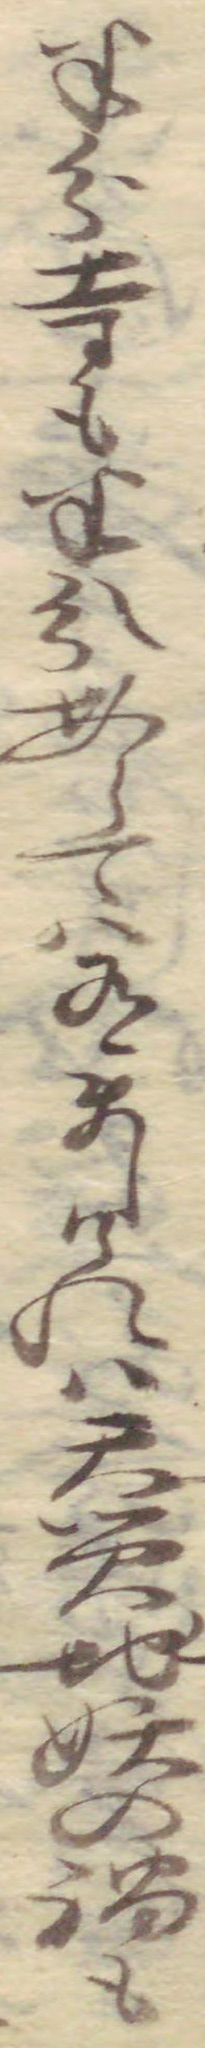半分寺も半分ならては有ましけれは天災地妖の禍も
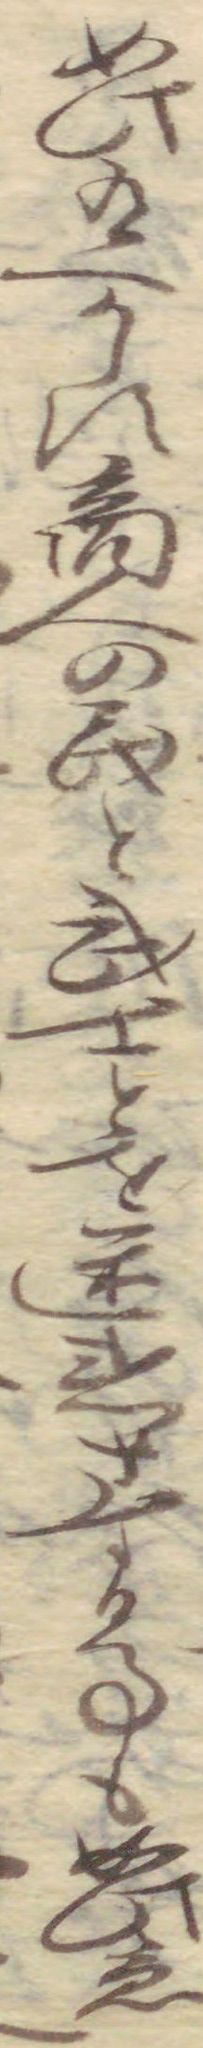如此有へからす商人の民と武士とを迷惑さする事も如此急
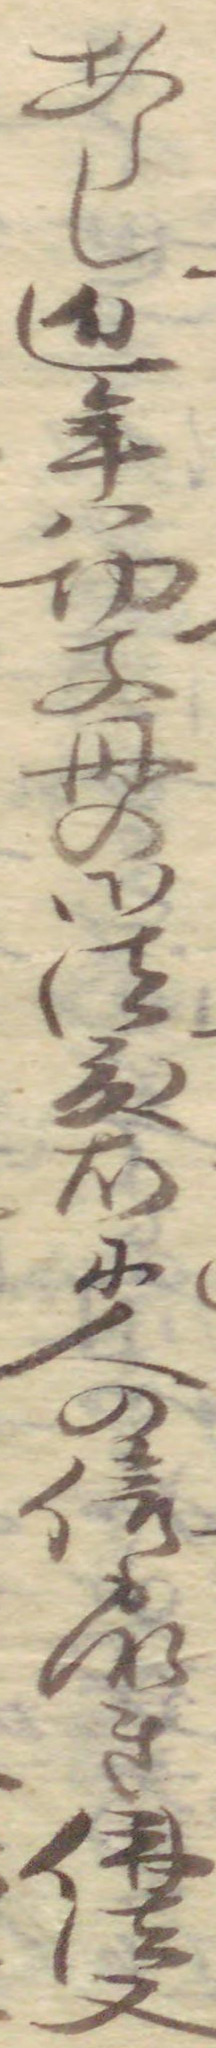ならし近年は切支丹の御法度故に人の信もなき仏法又
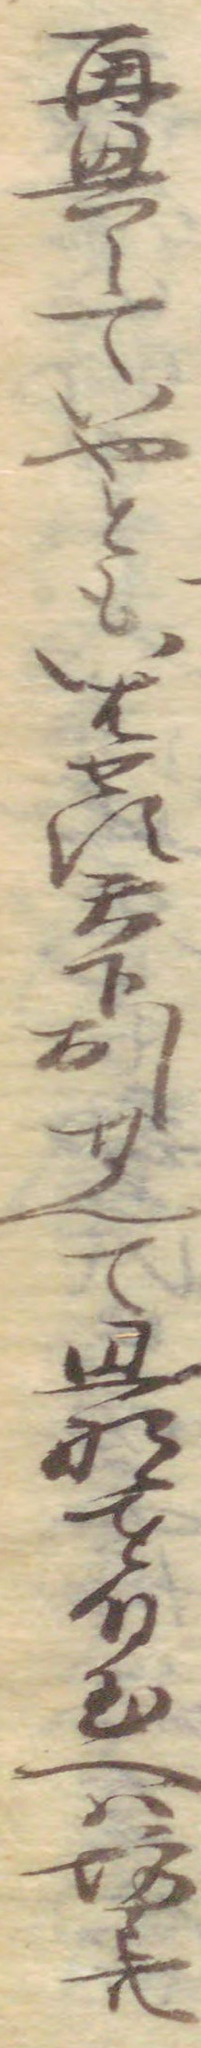再興していやともいはせす天下おしなへて旦那を付玉へは坊主共

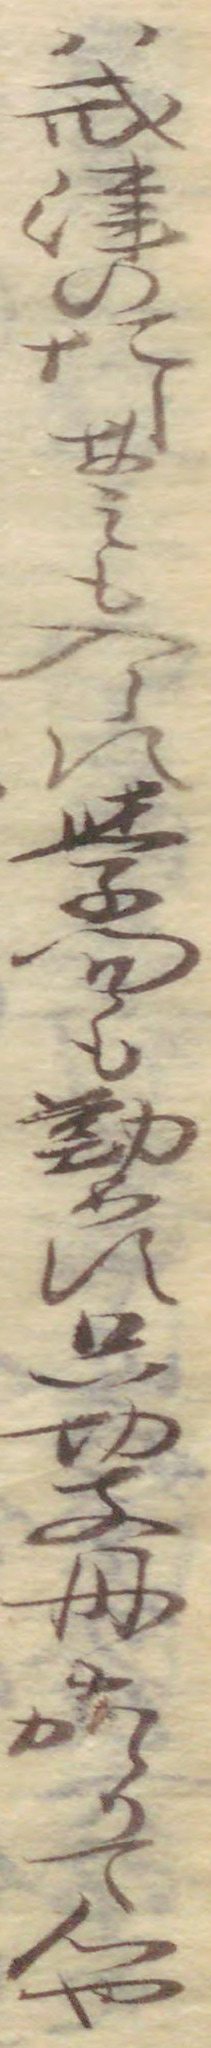は戒律のたしなみも入らす学問も勤めす只切支丹にかゝりて心や
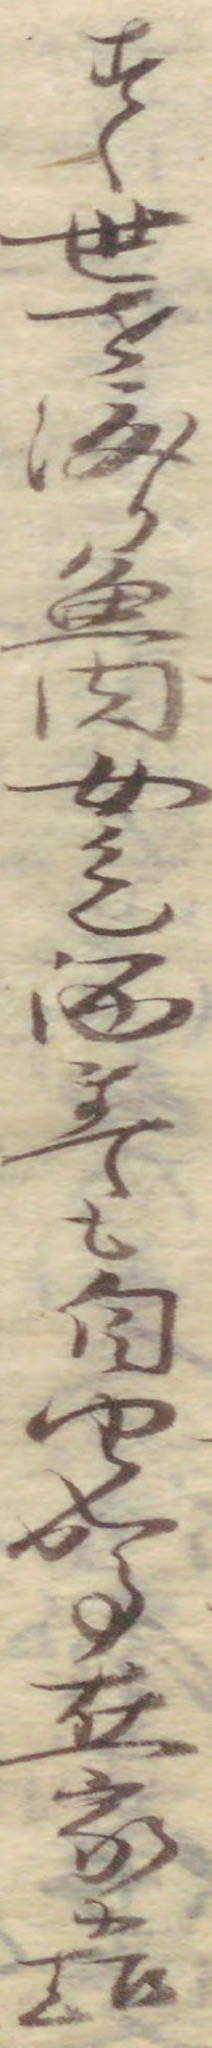すく世を渡り魚肉女色酒まても自由成事在家に超
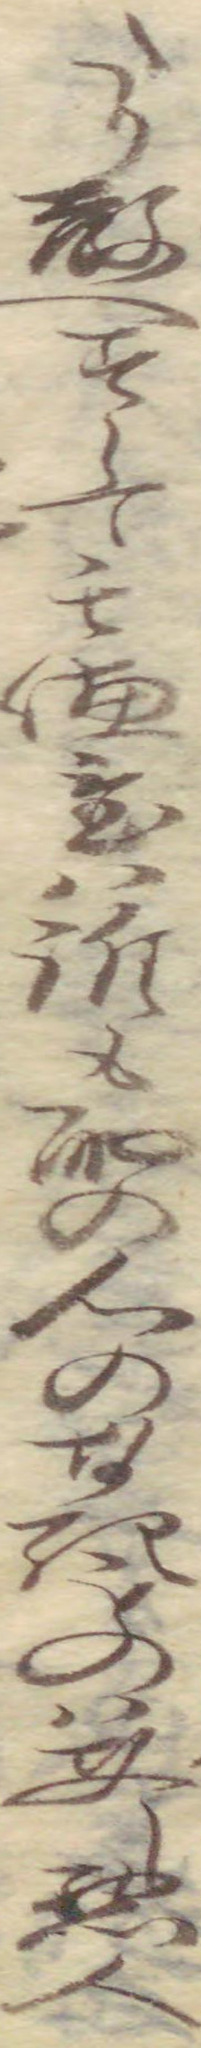たり教へすして其侭置は誰も恥の心のなきものはなし悪人
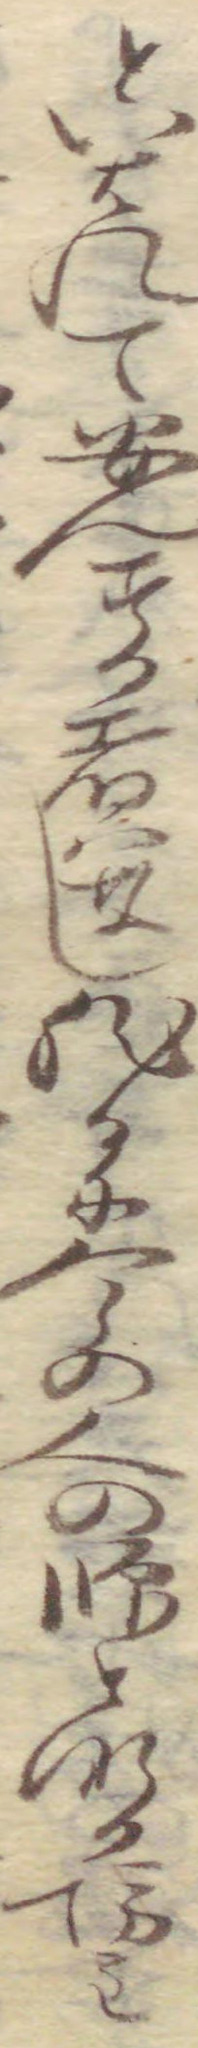といはれて安んする者はなし然るに今の人の師となる坊主
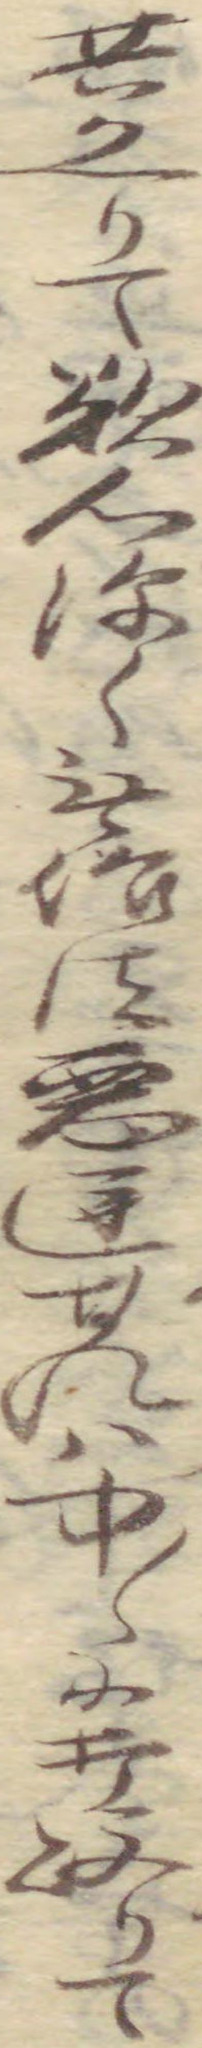共かへりて欲心深く無作法悪逆なれは中〳〵に打破りて
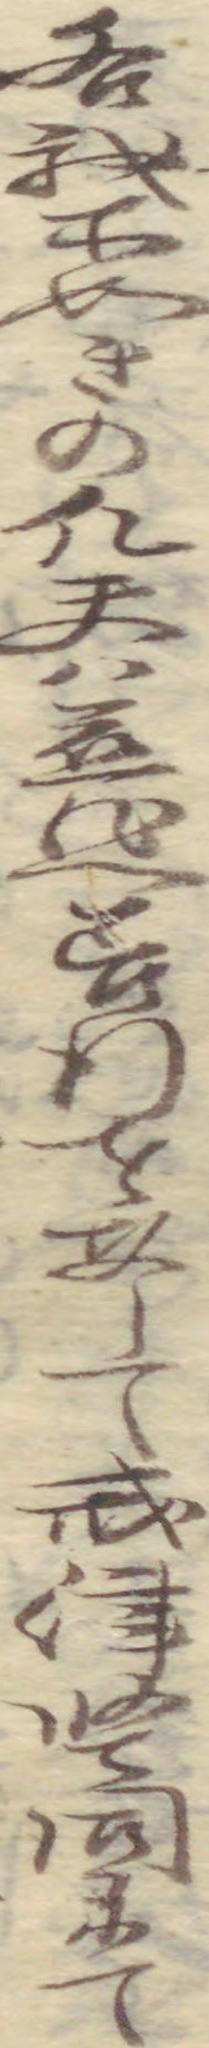各我等如きの凡夫は慈悲善行をなして戒律堅固にて
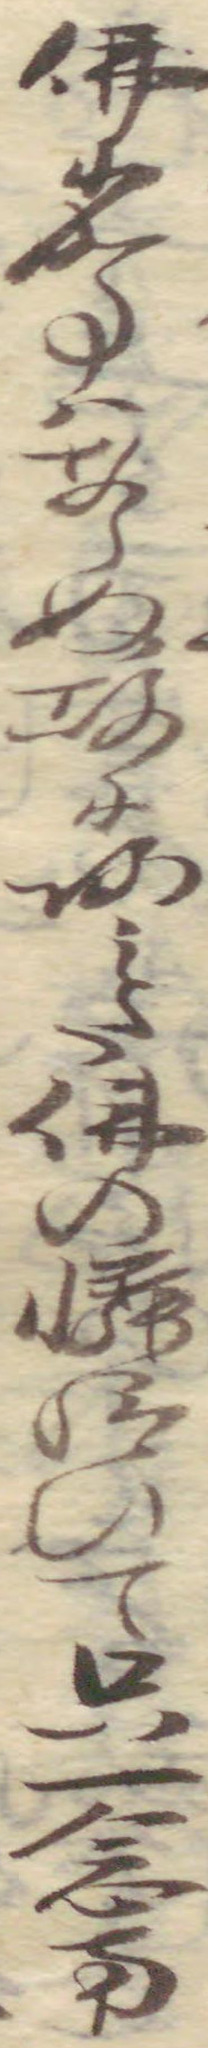仏に成事はならぬ故にあみた仏の憐給ひて只一念南
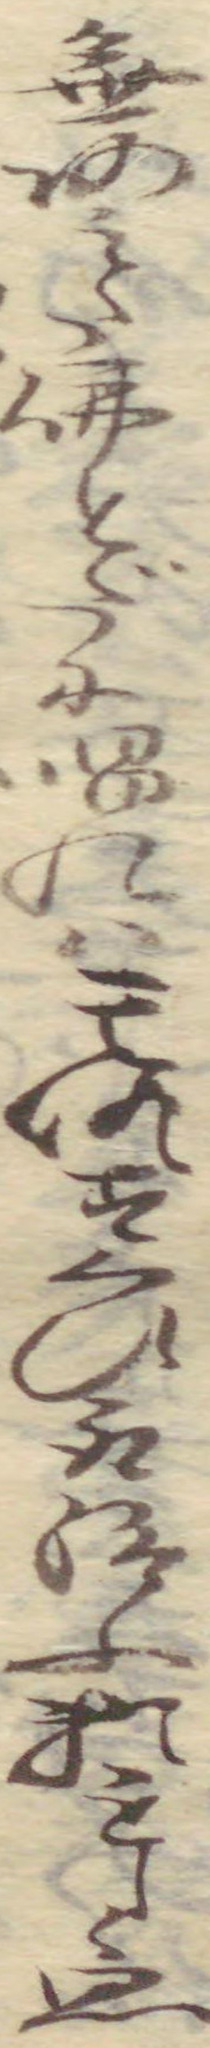無阿みた仏とだに唱れは其侭すくひ取給ふ頼もしく思
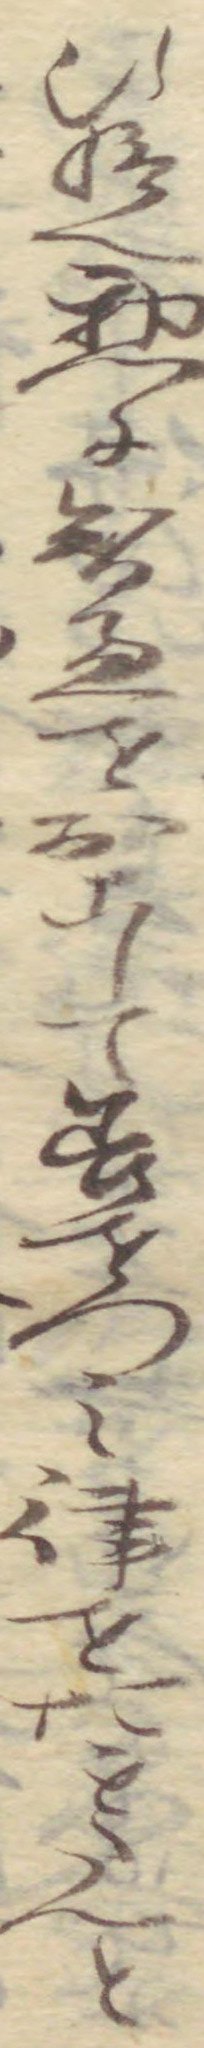ひ給へ憖に智恵をおこして善をつみ律をたもたんと
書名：鶯宿雑記. 巻263-264
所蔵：国立国会図書館 National Diet Library, JAPAN
